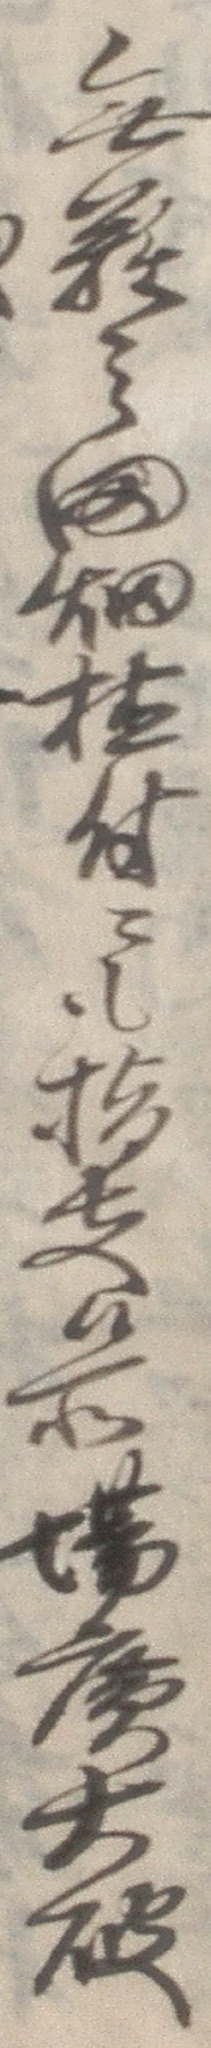無難之田畑植付二も指支候所場廣大破
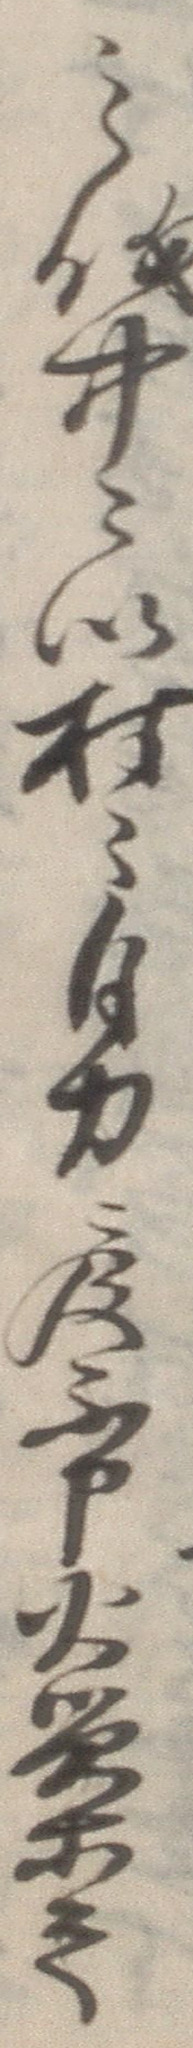之儀中々以村々自力二及不申火災等之
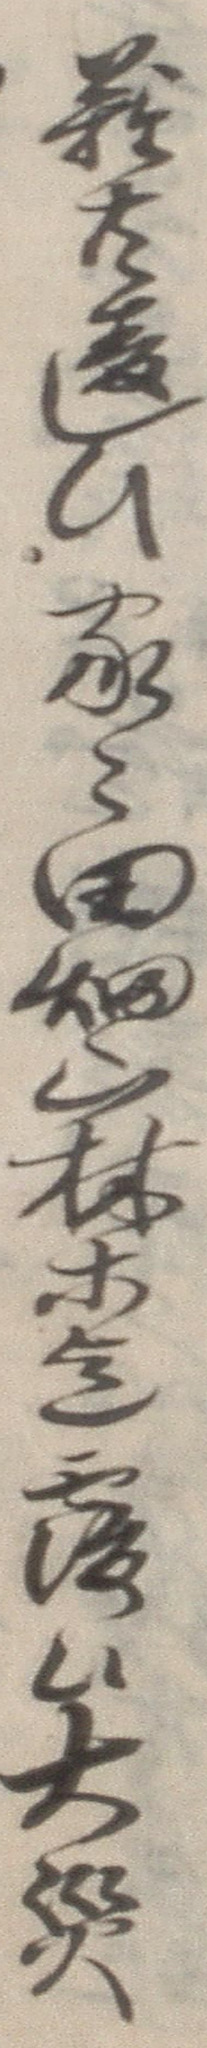難共違ひ家々田畑山林等迄覆ひ大災
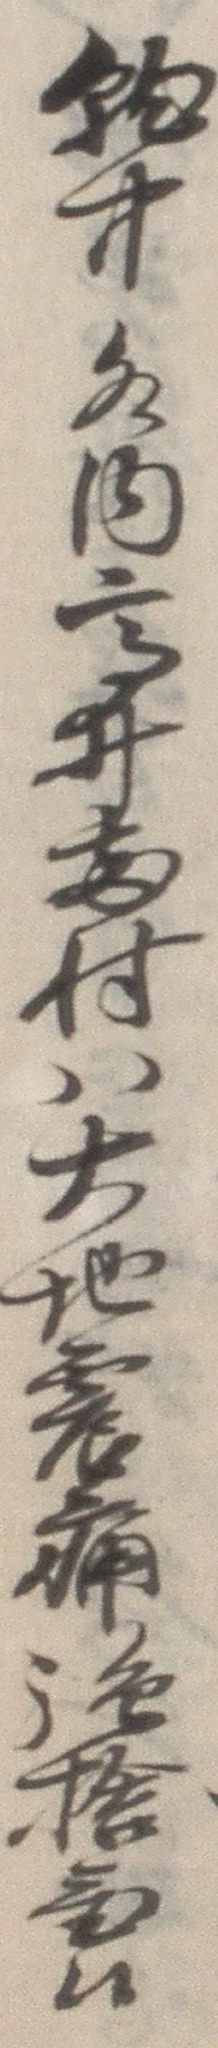就中水内高井両村ハ大地震痛強捨置候
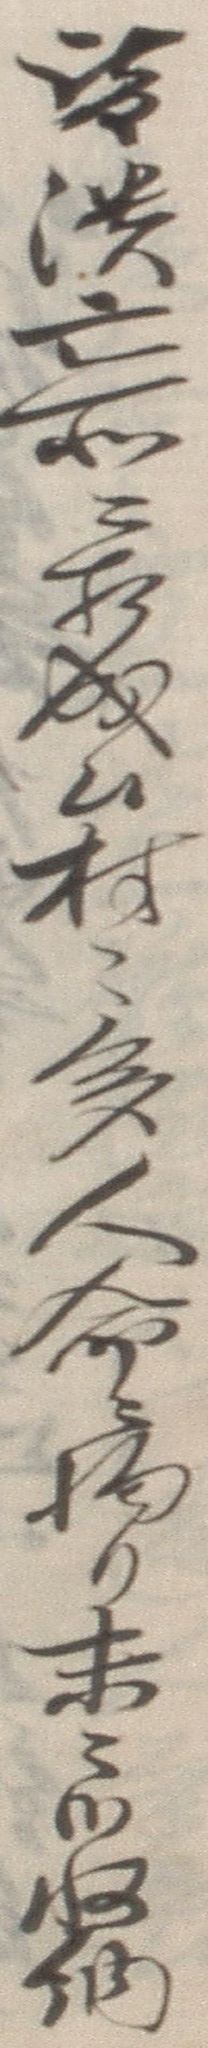皆潰亡所二相成候村々多人命二拘り末々御収納
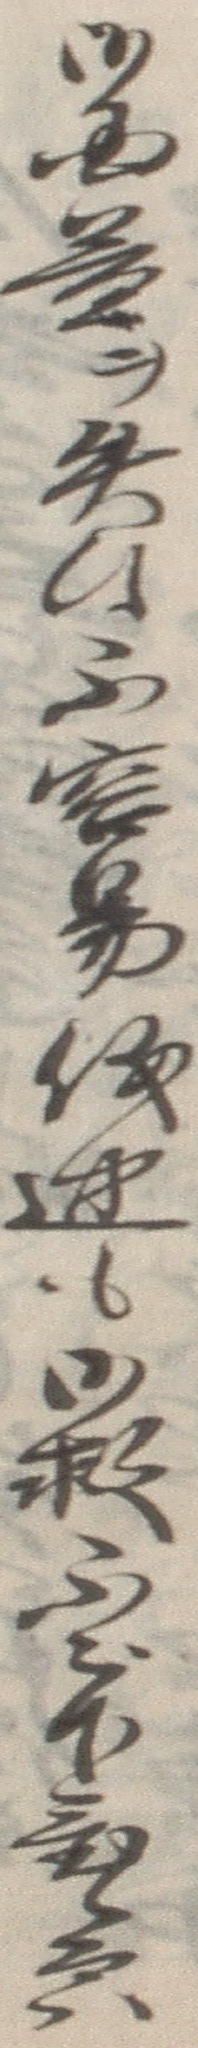御国益ヲ失ひ不容易儀迚も御救不被下置候而ハ
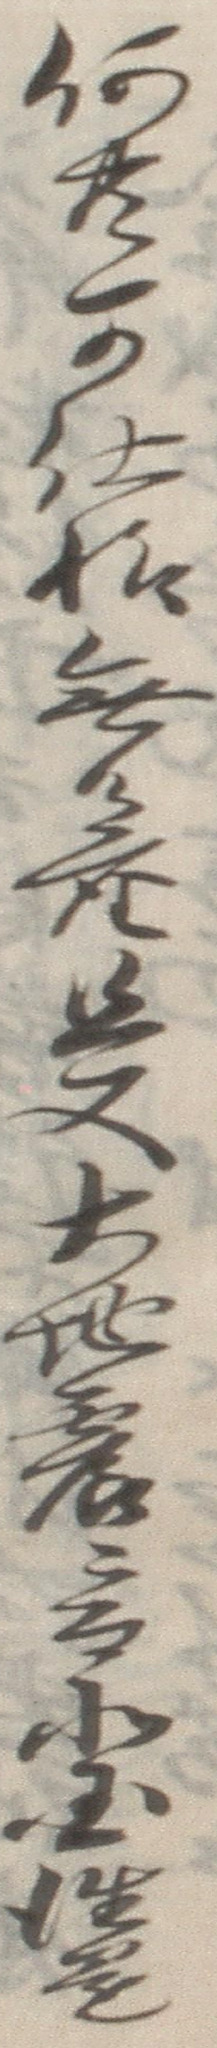何共可仕様無御座候且又大地震二而北国往還
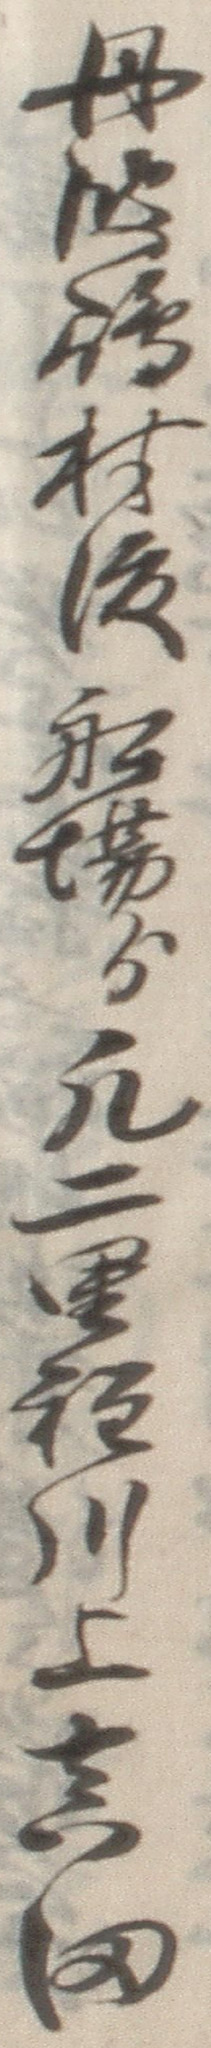丹波嶋渡船場ゟ凡二里程川上真田
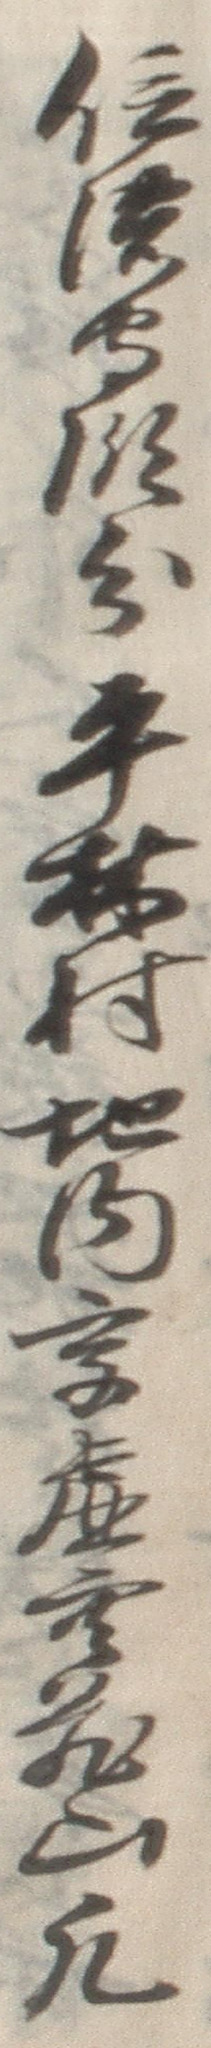信濃守領分平林村地内字虚空蔵山凡
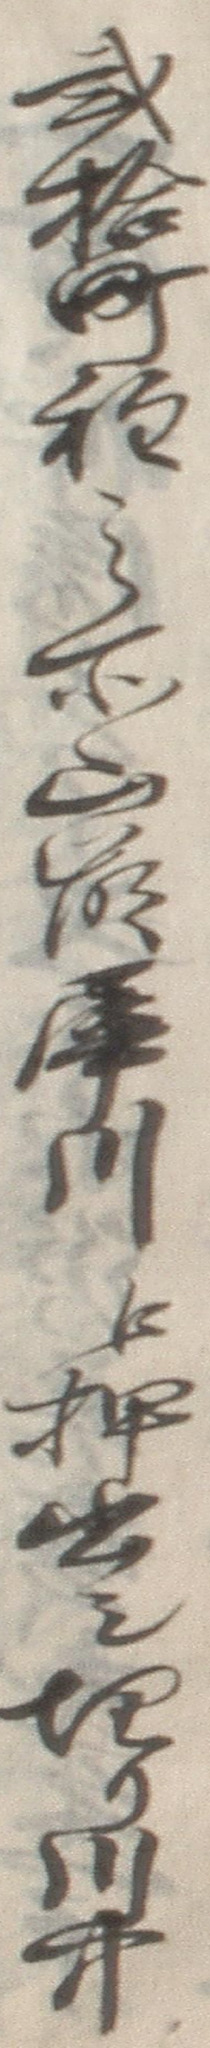弐拾町程之所山崩犀川江押出ㇱ埋り川中
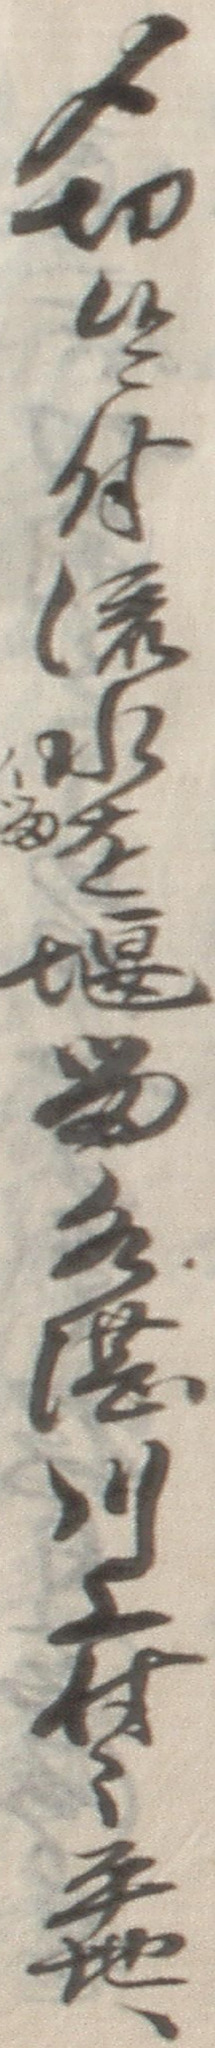〆切候二付流水を堰留水湛川上村々平地ㇸ
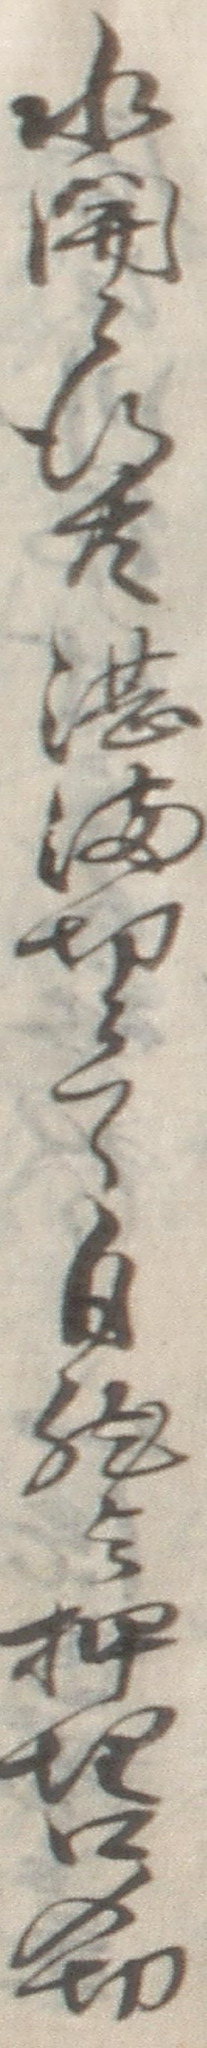水開候得共湛留切候ハゝ自然と押埋口〆切
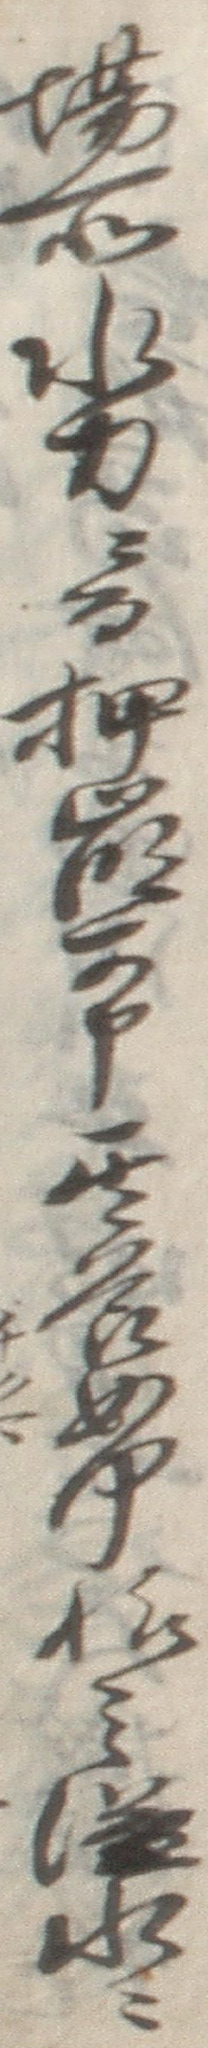場所水力二而押崩可申其節如何様之溢水二
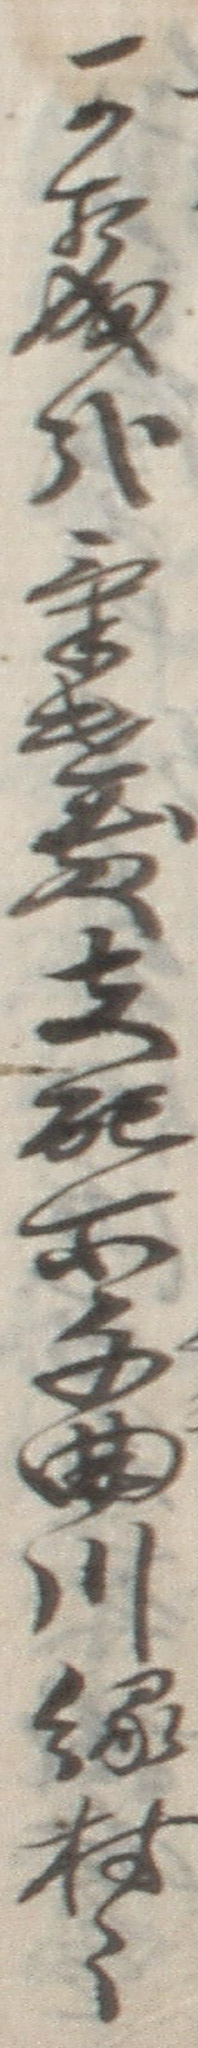可相成哉気遣敷支配所千曲川縁村々

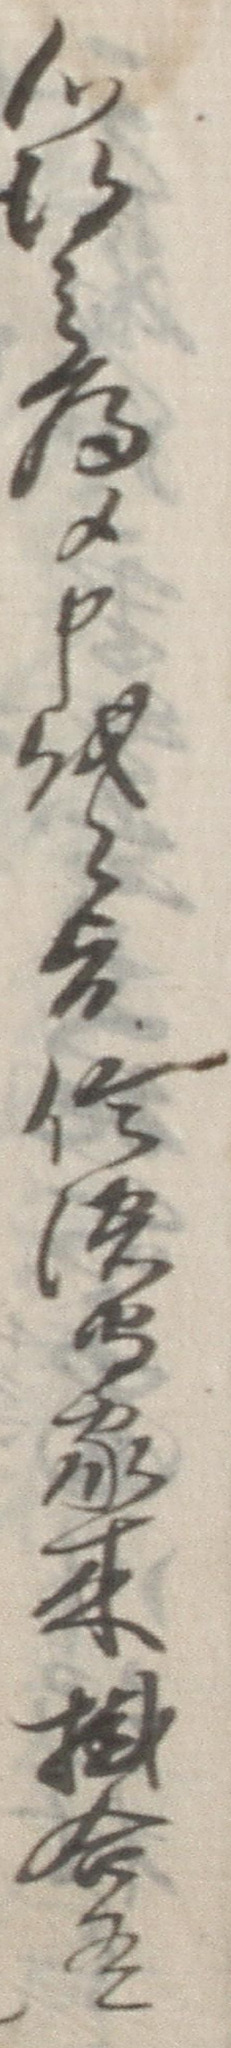心得之為メ申越候旨信濃守家来掛合有
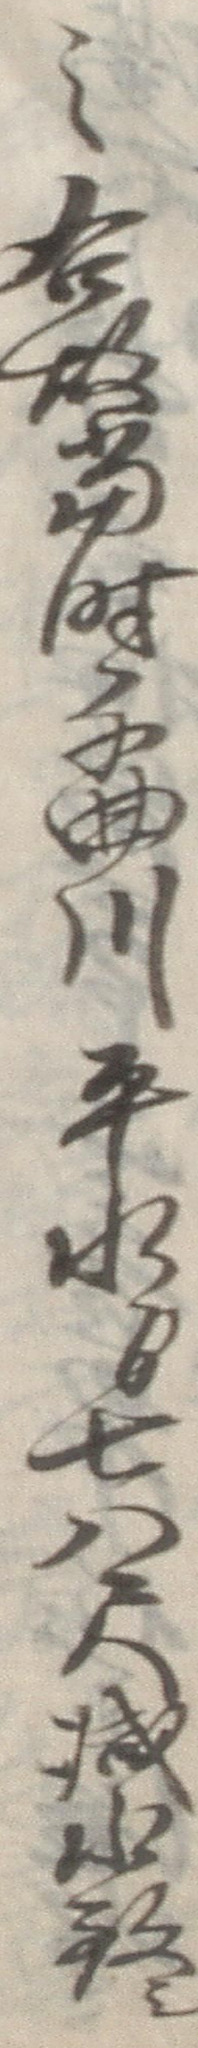之右故当時千曲川平水ゟ七八尺減水致ㇱ
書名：信州地震一件
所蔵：東京大学地震研究所図書室 Earthquake Research Institute Library, The University of Tokyo, JAPAN
